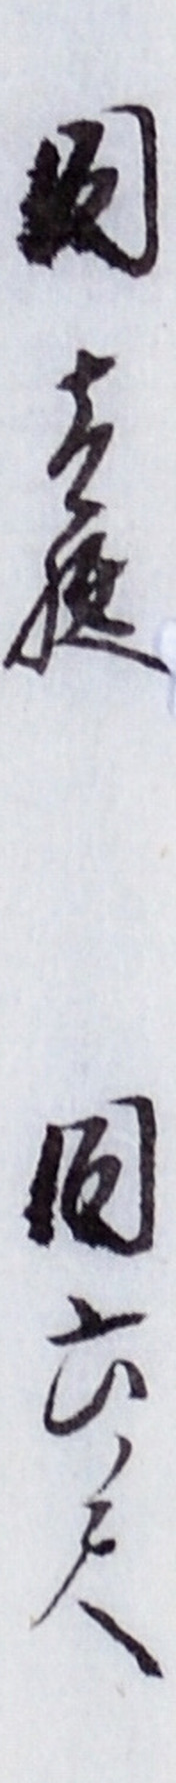同壱挺同八ノ尺
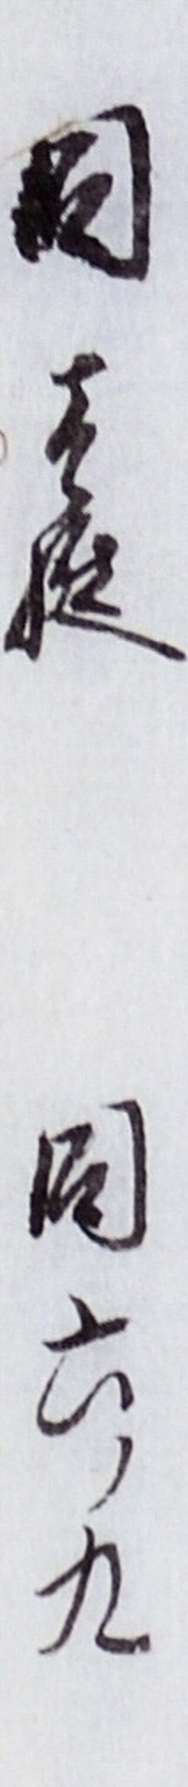同壱挺同六ノ九
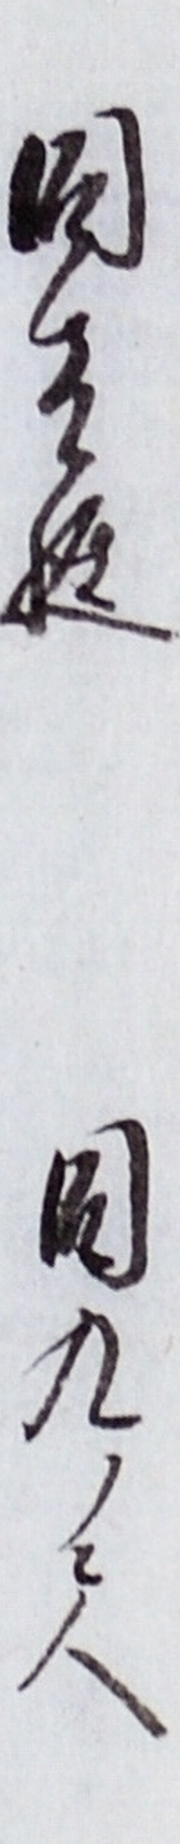同壱挺同八ノ尺
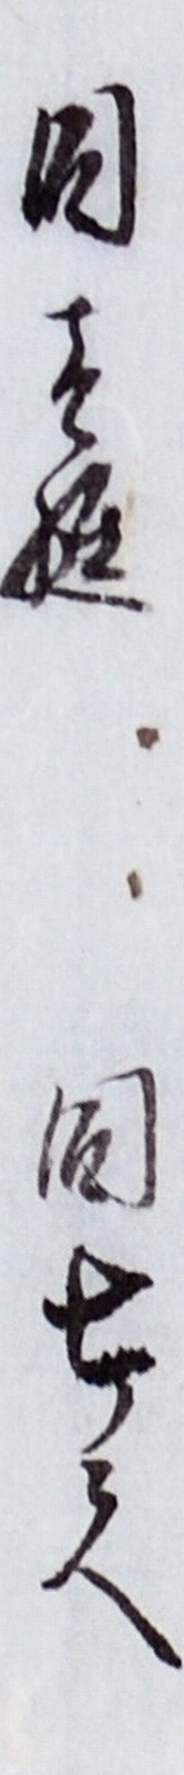同壱挺同七ノ尺
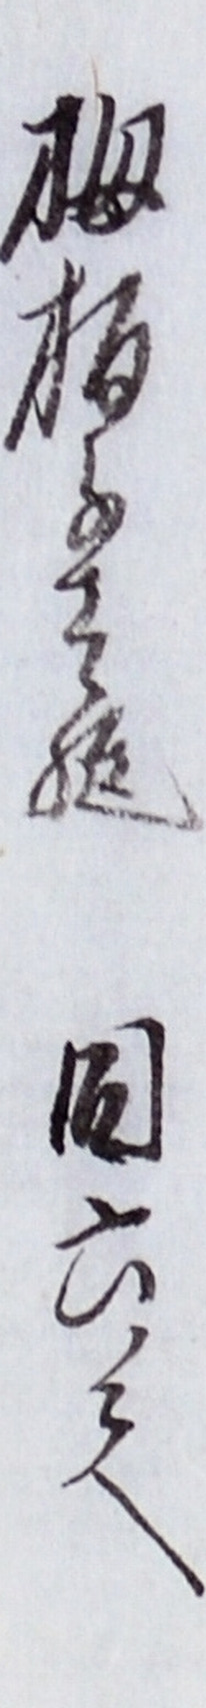栂板子壱挺同六ノ尺

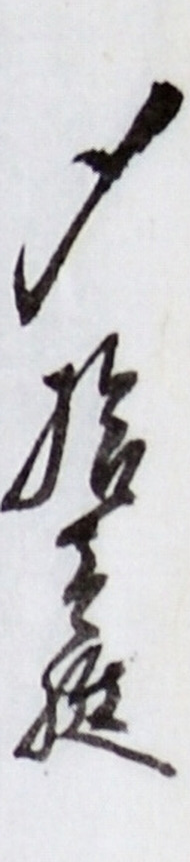〆拾壱貫
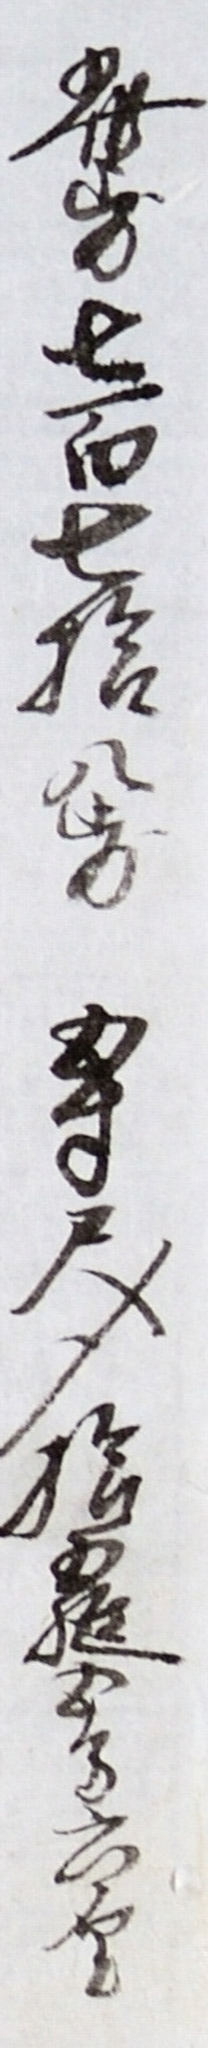此歩七百七拾八歩五寸尺〆拾五挺ゟ六厘
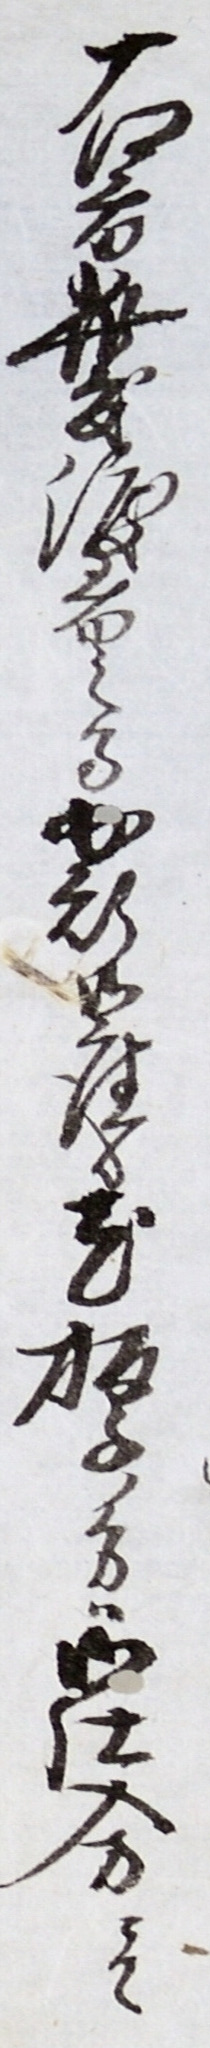右方此度渡来之方出軒御座候尤板子の方ハ御仕入分ニて
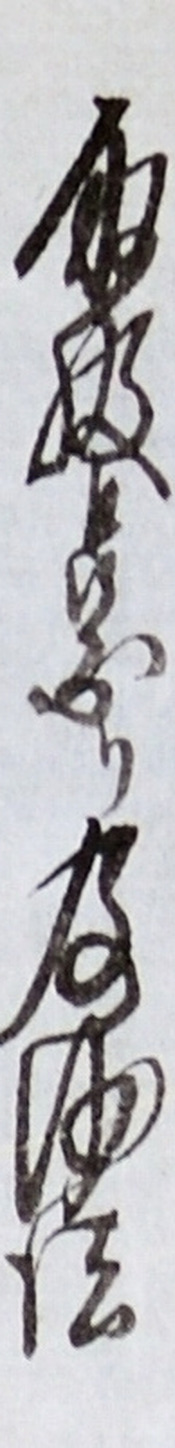取扱候図り及沙汰
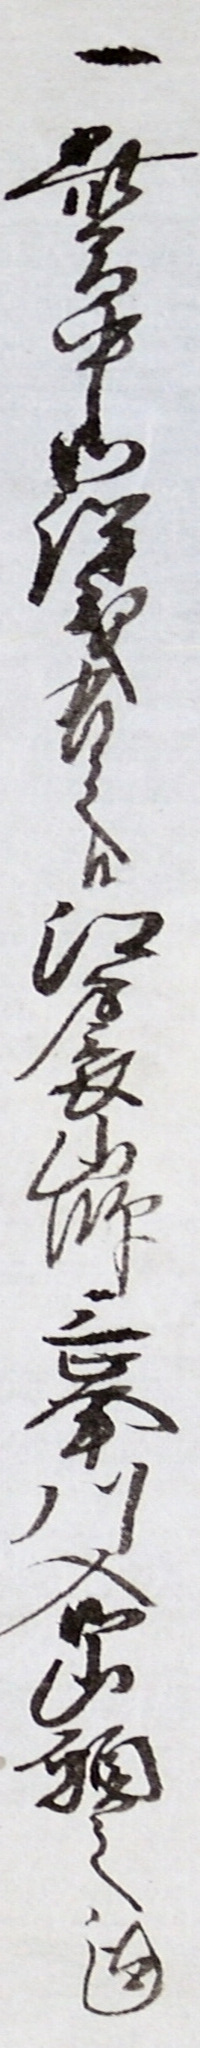一此間中御評義有之候江戸表山師三峯川入御山願之趣
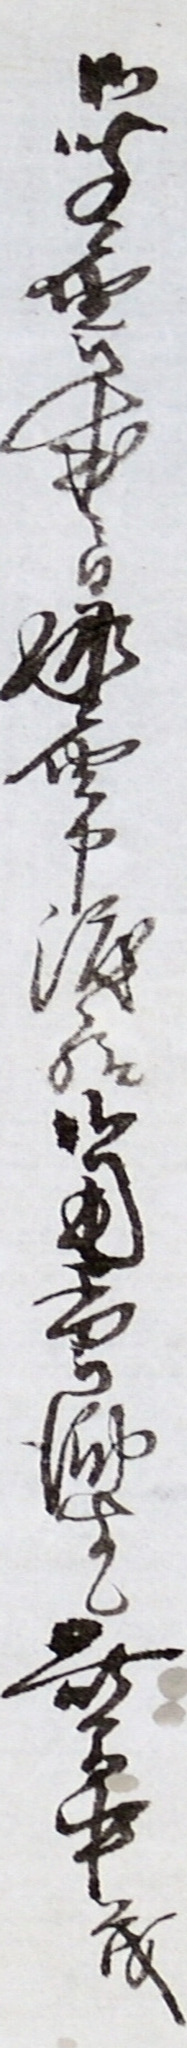御聞届候成ニ付承届申渡候様御用番御用無中も
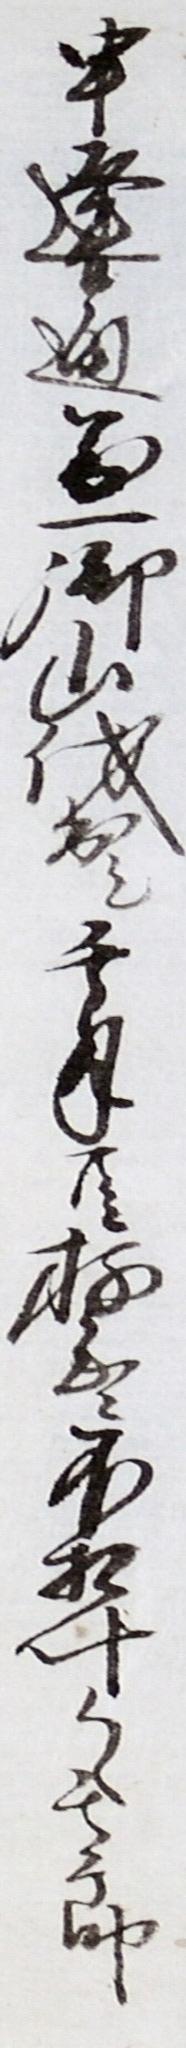申遣候通万一御山伐出シ其月共ニ不相叶ら其節
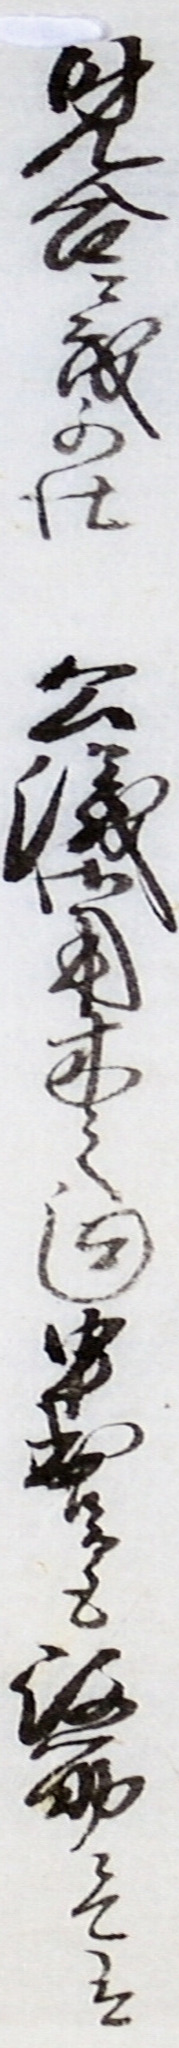見合ニも可仕公儀御用木之趣申出候而も役筋ニては
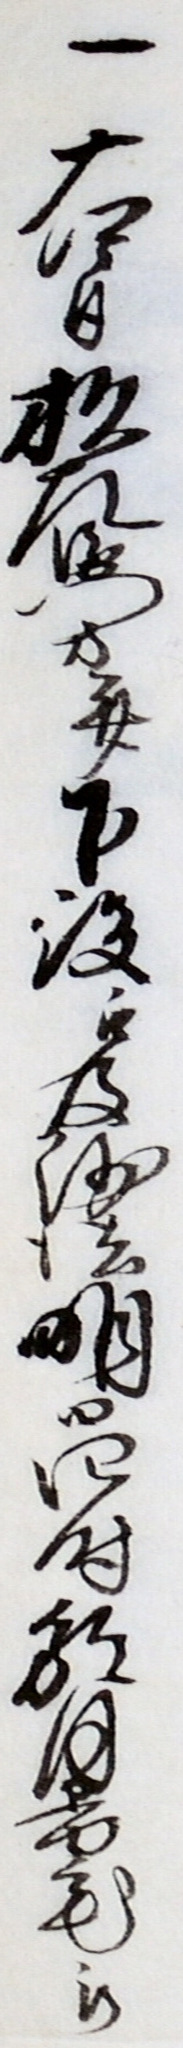一右書付杉左衛門方并下役江及沙汰明日四時朝月番宅被
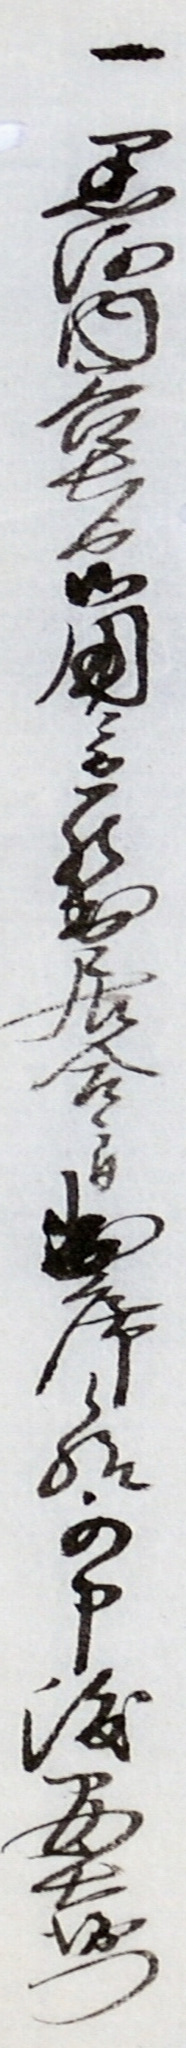一黒河内善右衛門御用ニ而罷出居合ニ付出席候様可申渡安右衛門
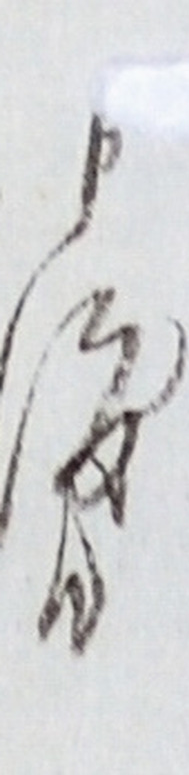申渡候
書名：御山奉行御用控
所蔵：伊那市立高遠町図書館・合同会社AMANE
